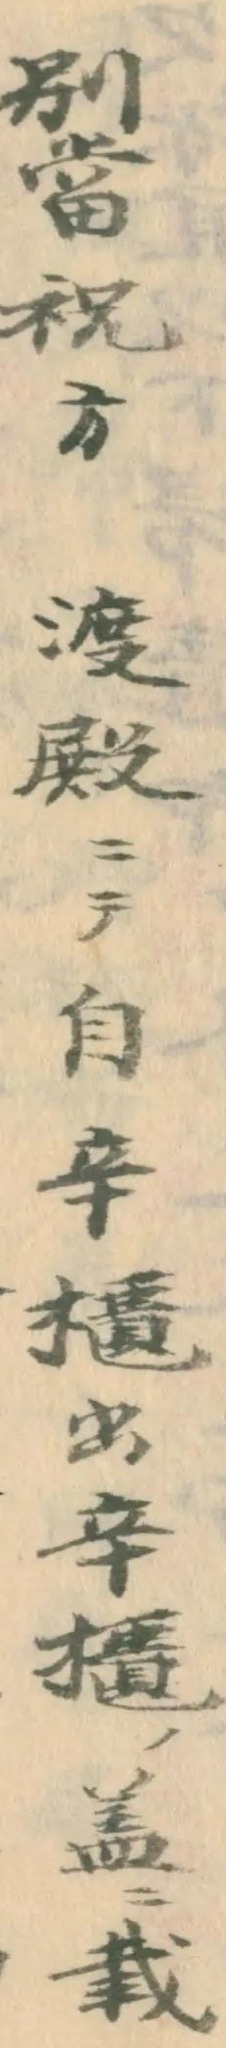別当祝方渡殿ニテ自辛櫃出辛櫃ノ蓋ニ載
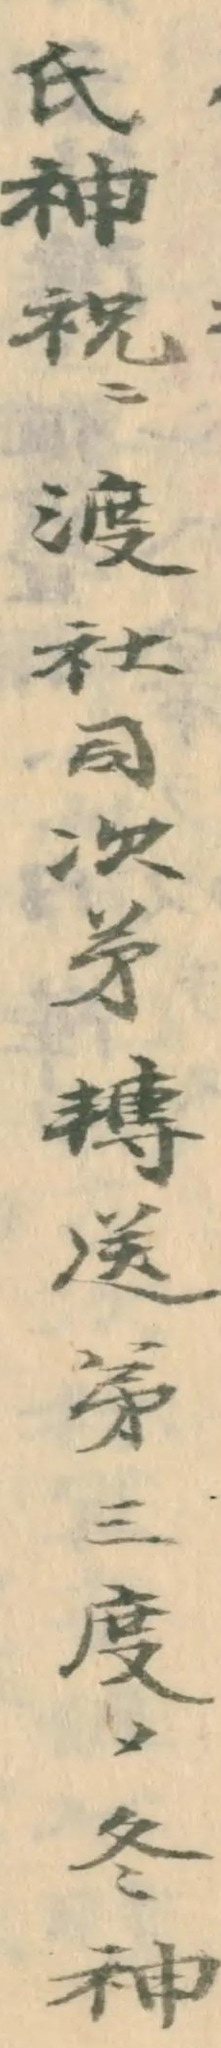氏神祝ニ渡社司次第転送第三度メ冬神
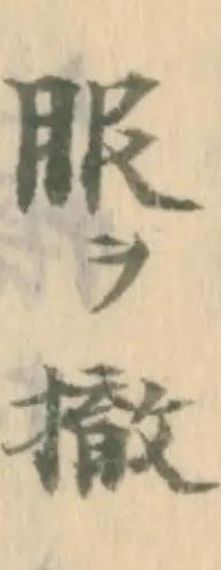服ヲ撤
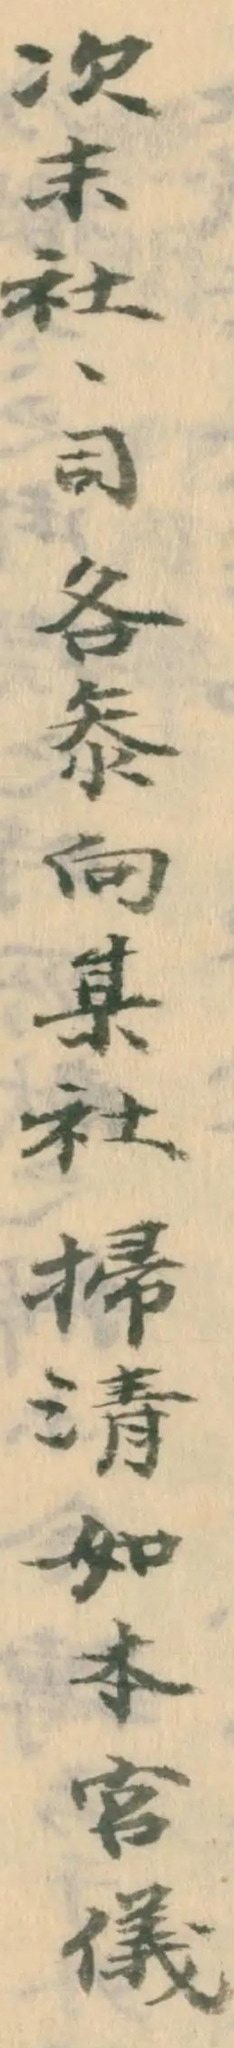次末社々司各参向某社掃清如本宮儀
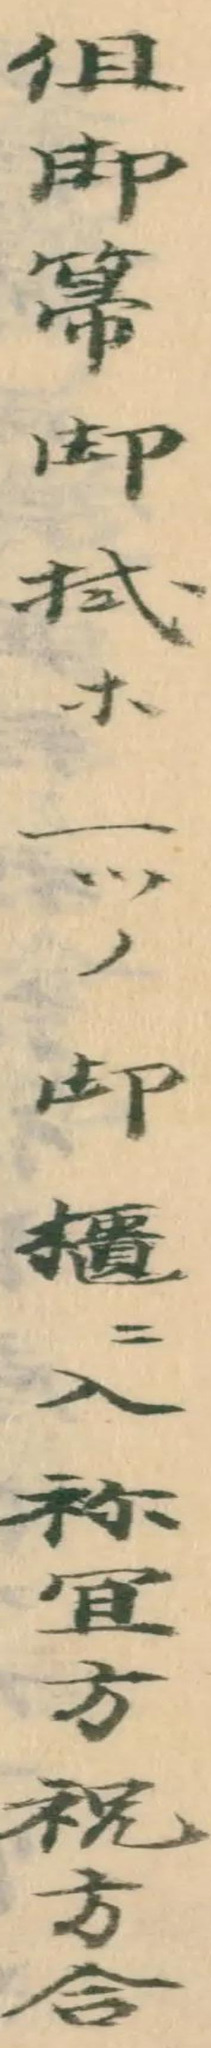但御幣御拭等一ツノ御櫃ニ入禰宜方祝方合
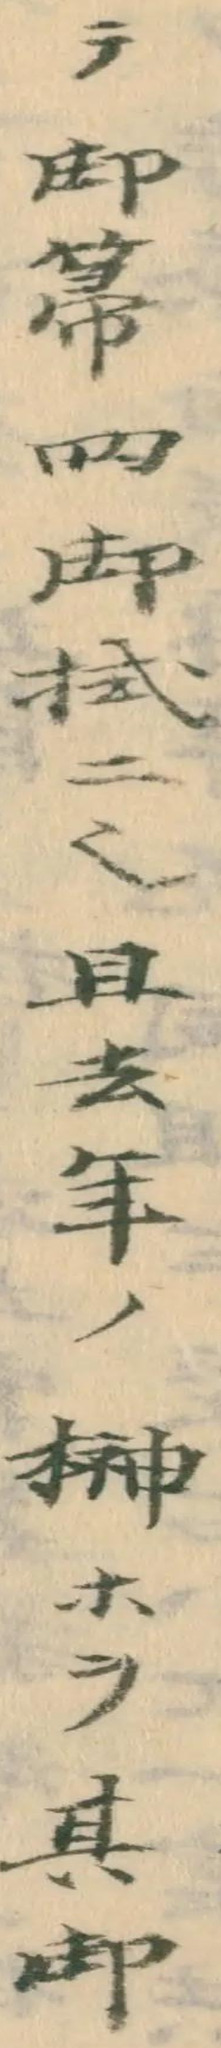テ御箒四御拭二也且去年ノ榊等ヲ其御
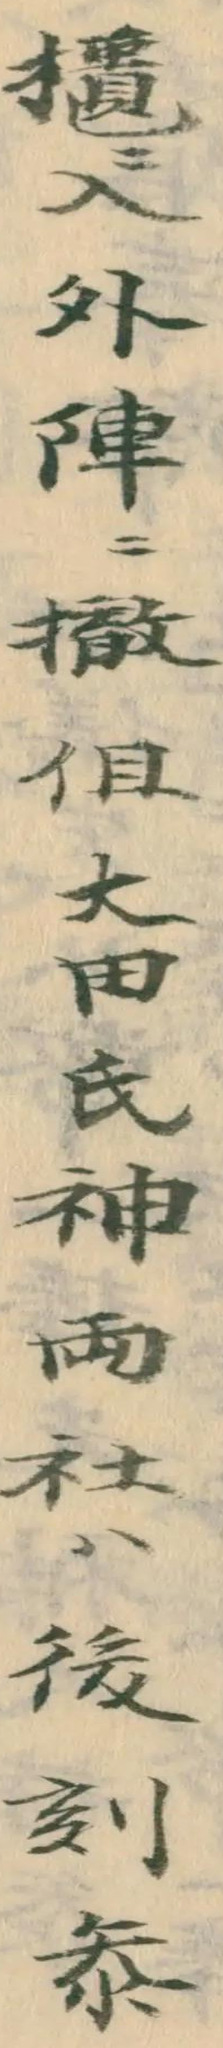櫃ニ入外陣ニ撤但大田氏神両社ハ後刻参
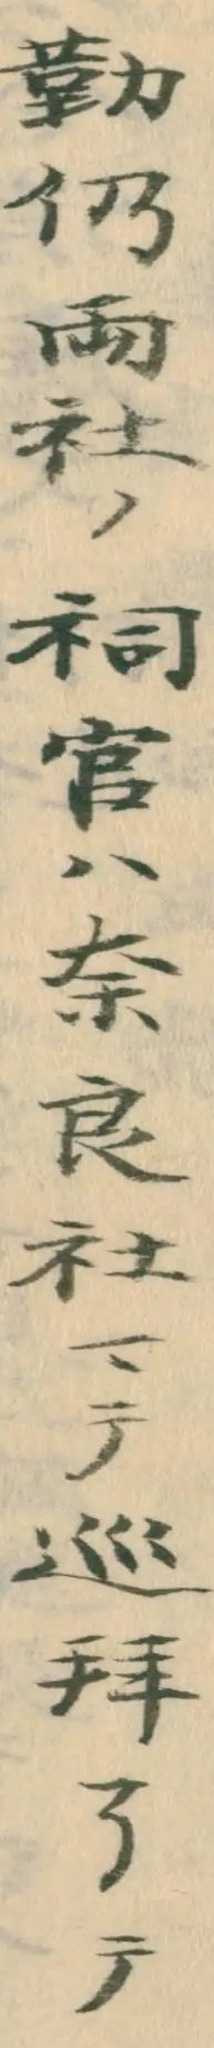勤仍両社ノ祠官ハ奈良社マテ巡拝了テ
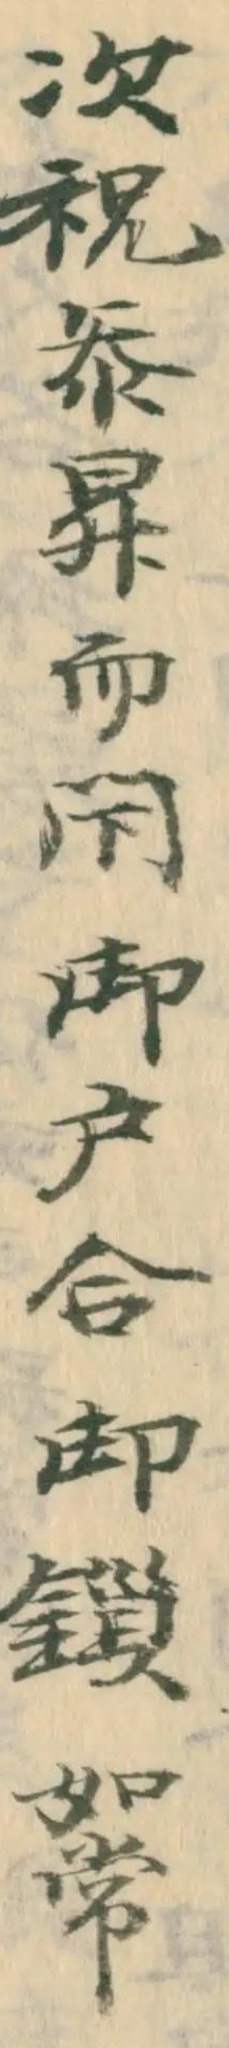次祝参昇而閉御戸合御鎖如常
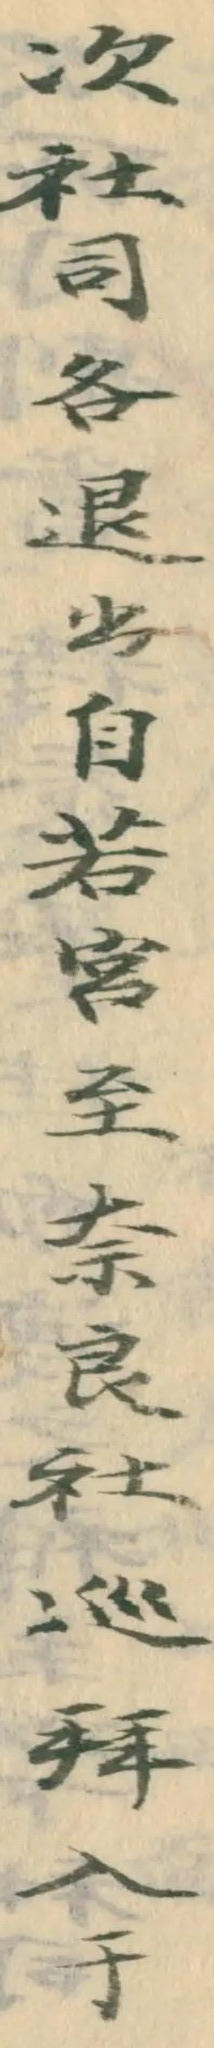次社司各退出自若宮至奈良社巡拝入于
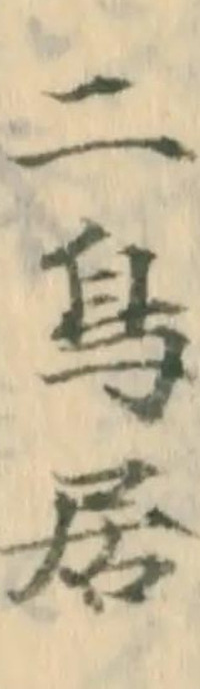二鳥居

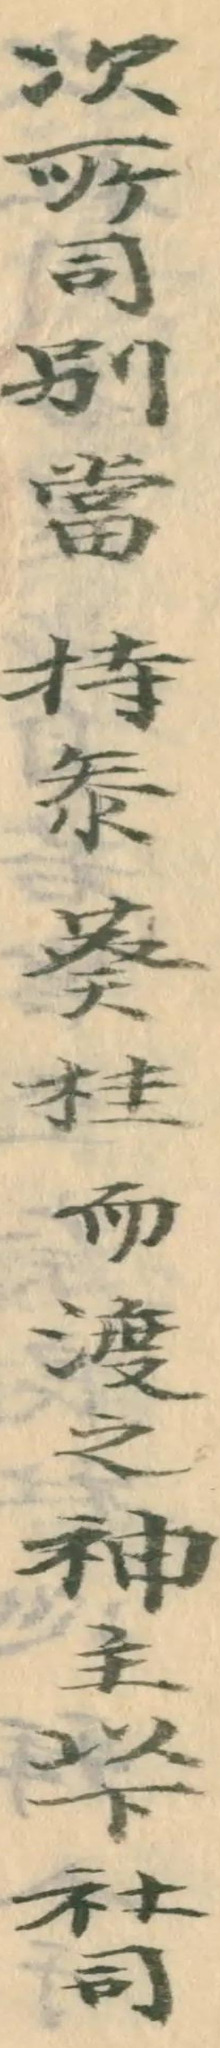次所司別当持参葵桂而渡之神主以下社司
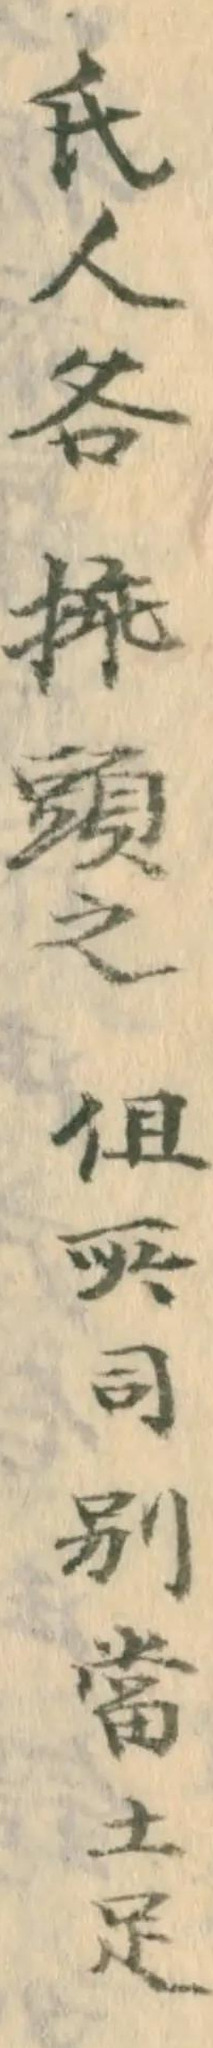氏人各挿頭之但所司別当土足
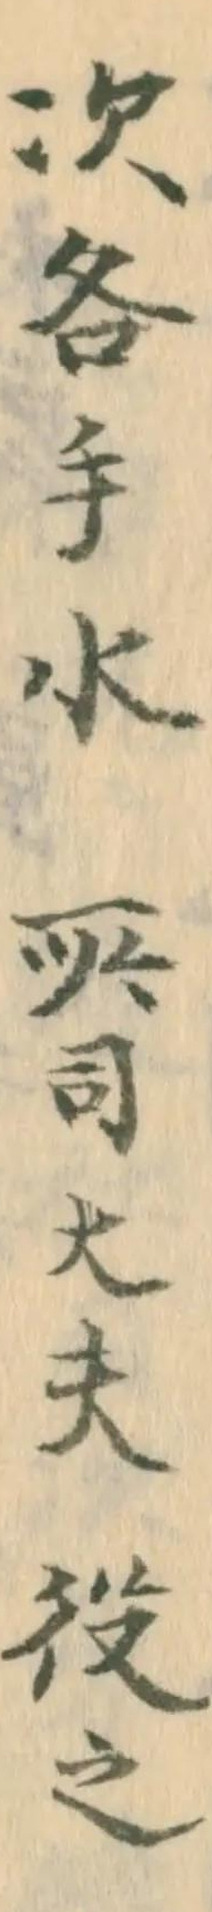次各手水所司大夫役之
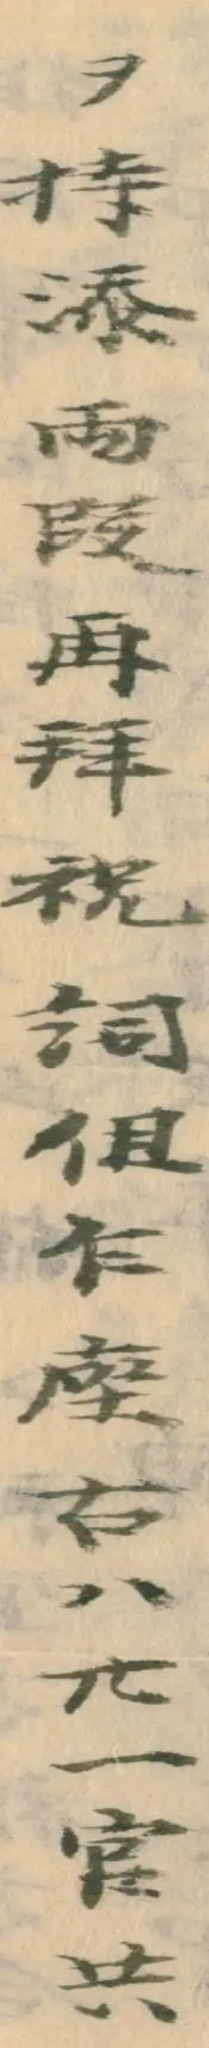ヲ持添両段再拝祝詞但乍座古ハ廿一官共
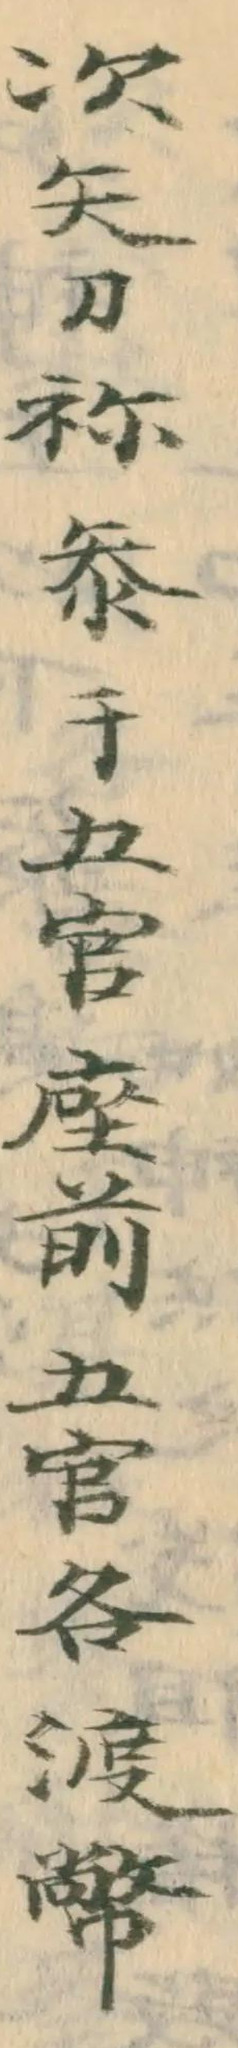次矢刀禰参于五官座前五宮各渡幣
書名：賀茂社記録. 第5冊
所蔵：国立国会図書館 National Diet Library, JAPAN
